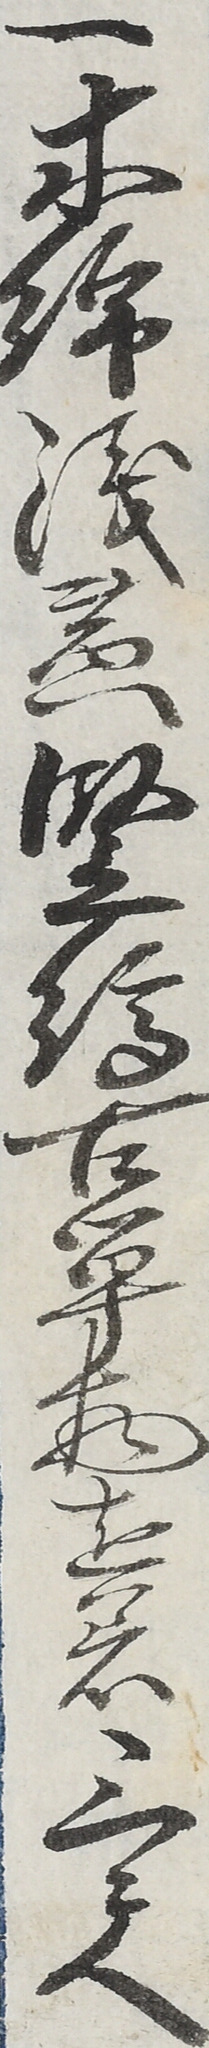一木綿浅黄竪縞古単物を着三尺
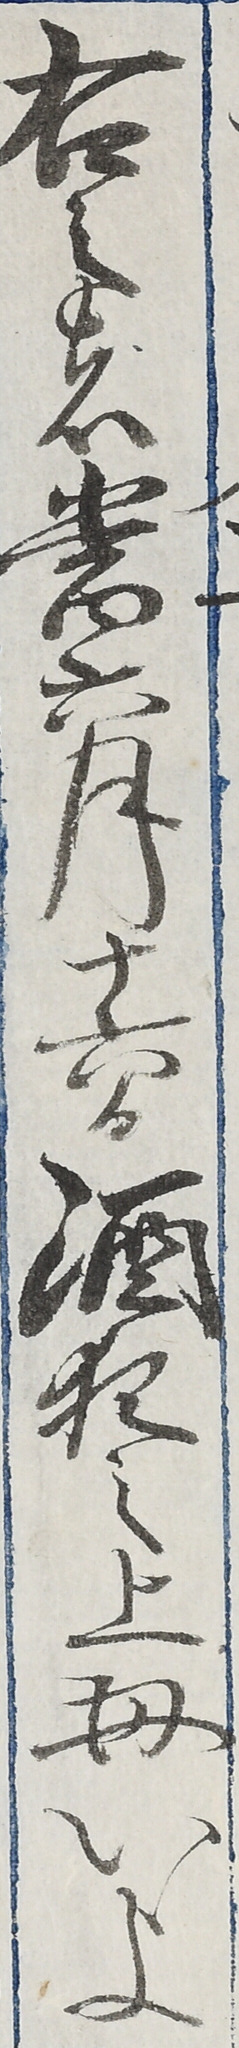右之者当六月十六日酒犯之上母いよ
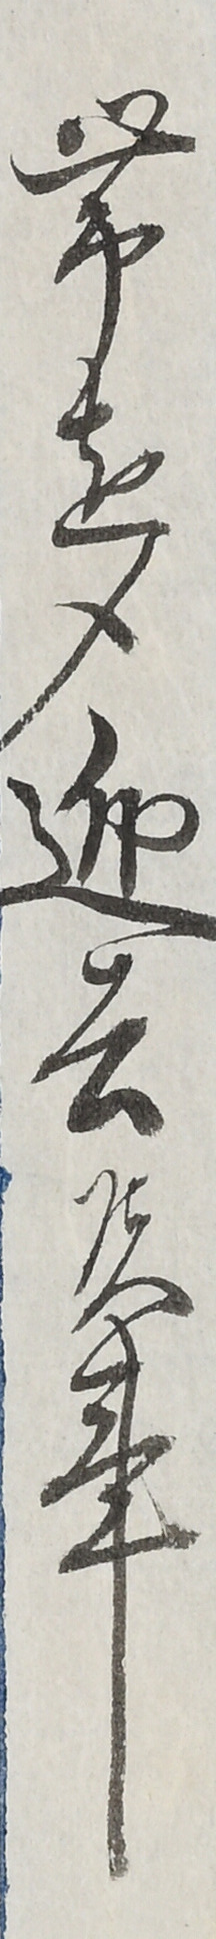帯を〆逃去候事
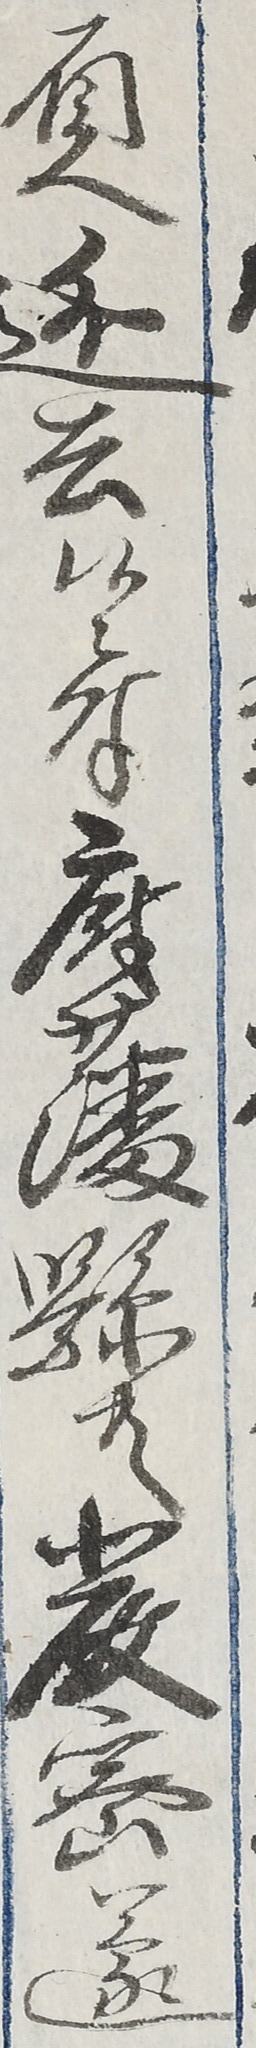負逃去候ニ付府藩県共厳密遂
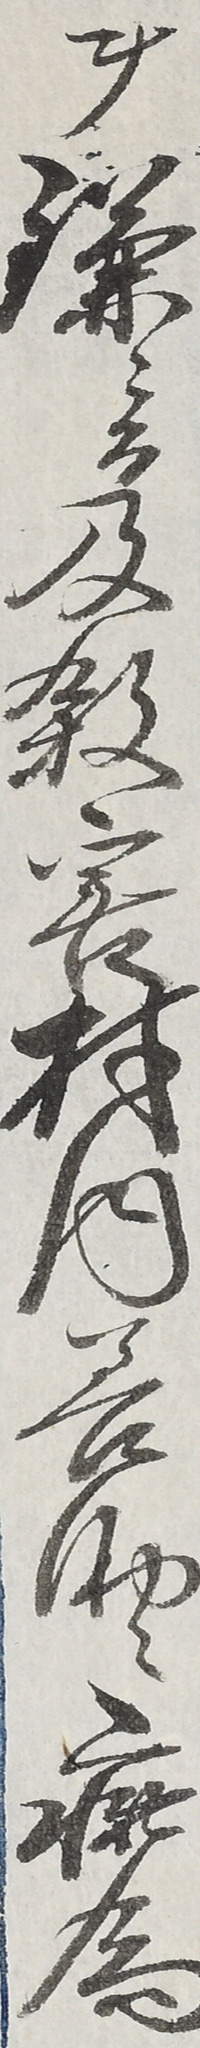ヲ鎌ニ而及殺害村内善助ニ疵為
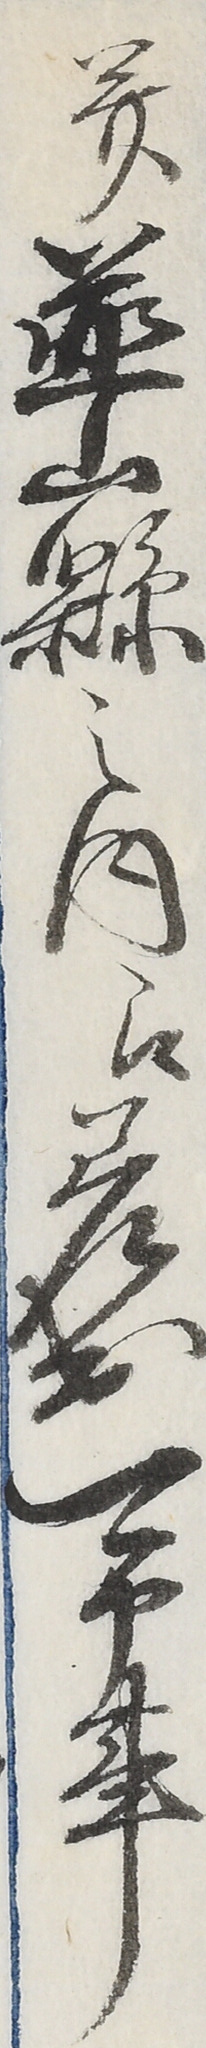幷韮山県之内江差出可申事
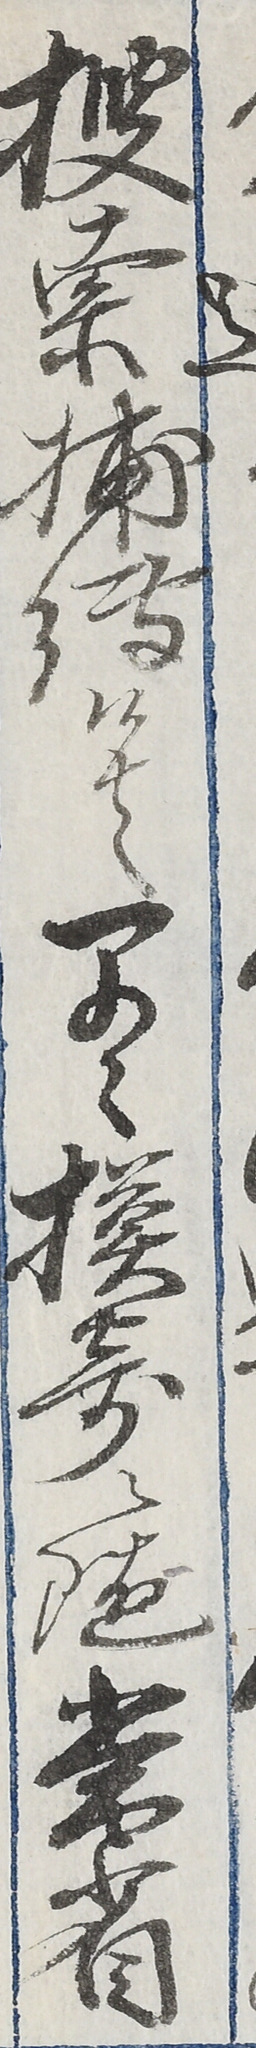捜索捕縛候者早々模寄ニ随常省
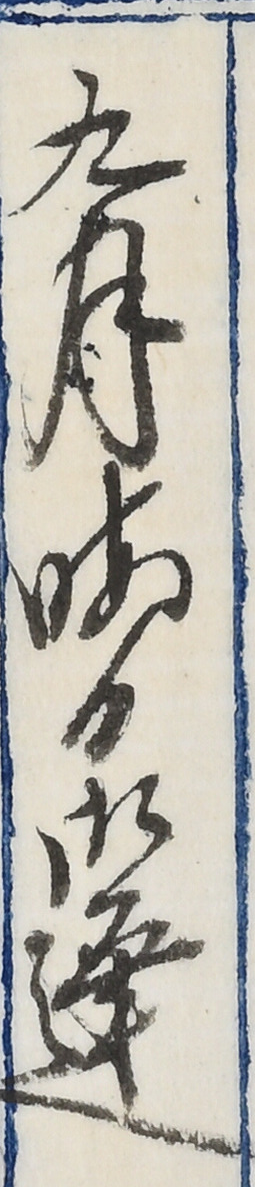九月晦日御達
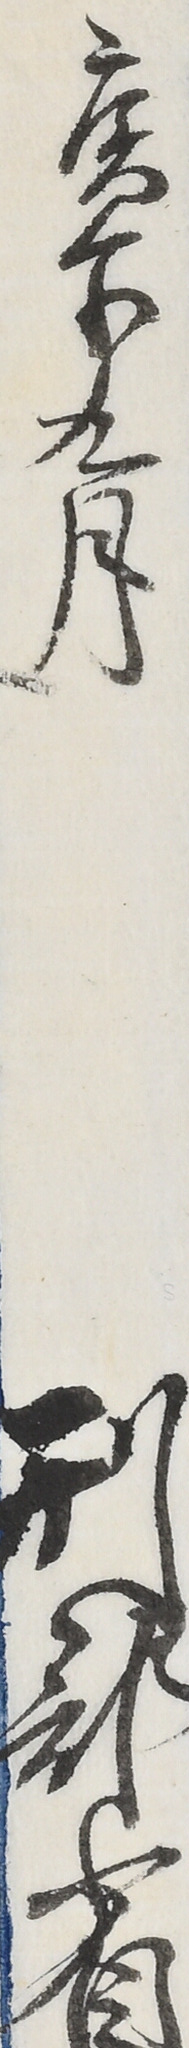庚午九月刑部省
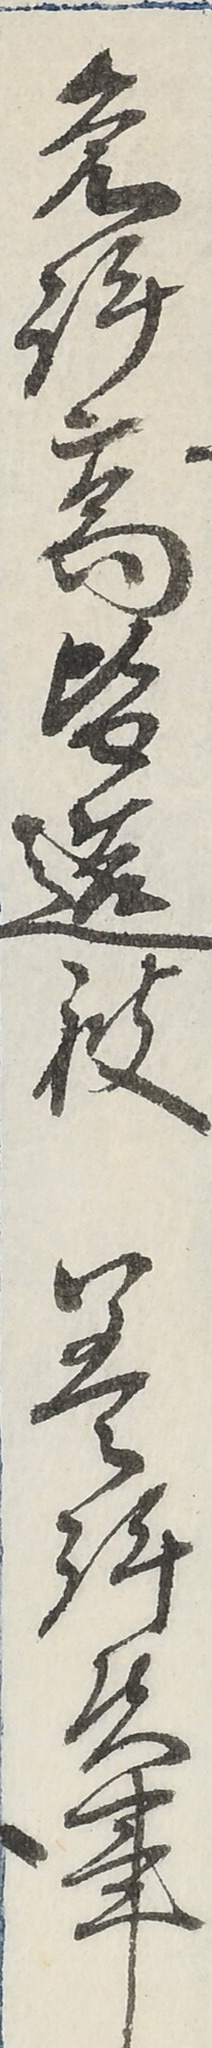免許商皆造被差許候事
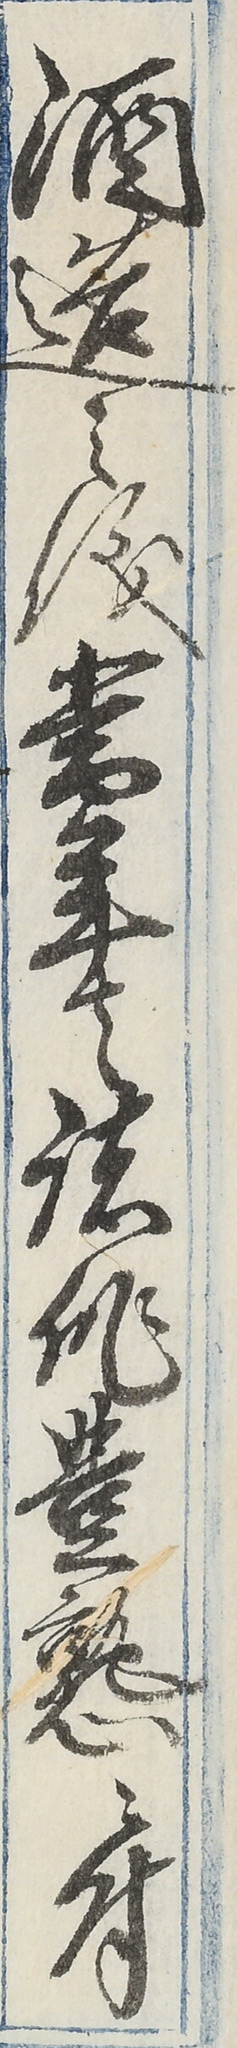酒造之儀当年者諸作豊熟ニ付
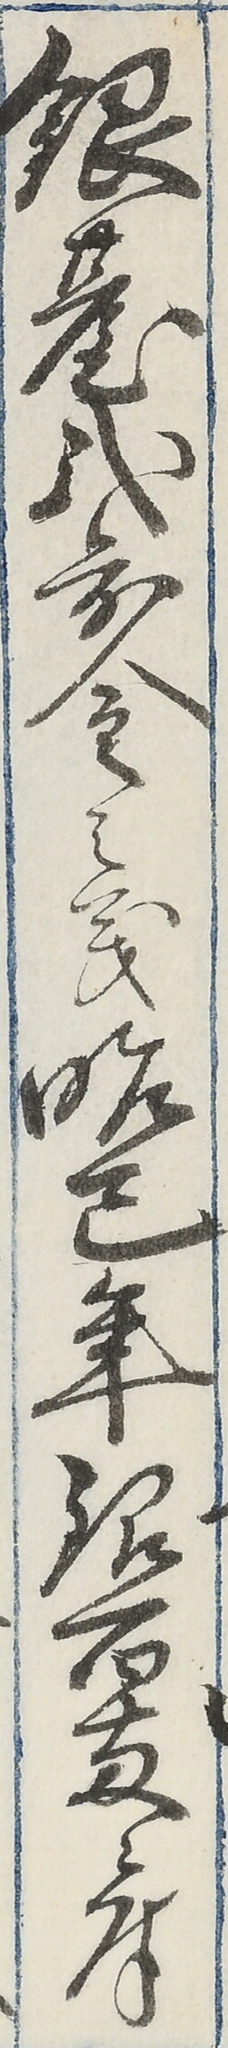銀台弐歩金之義昨巳年限百両ニ付
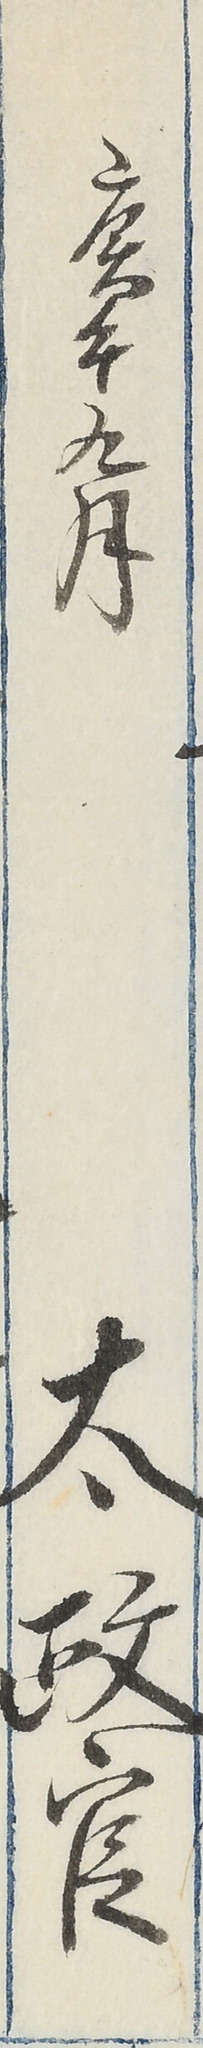庚午九月太政官
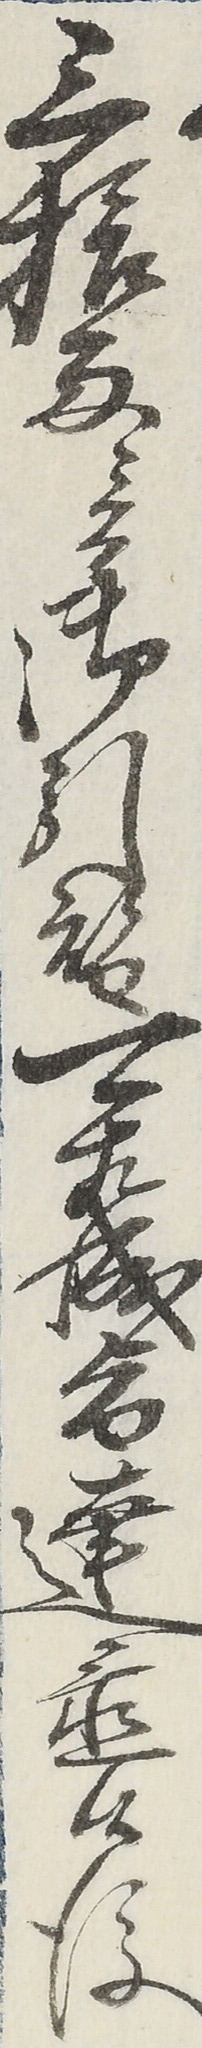三拾両ニ而御引替可相成旨達置候後
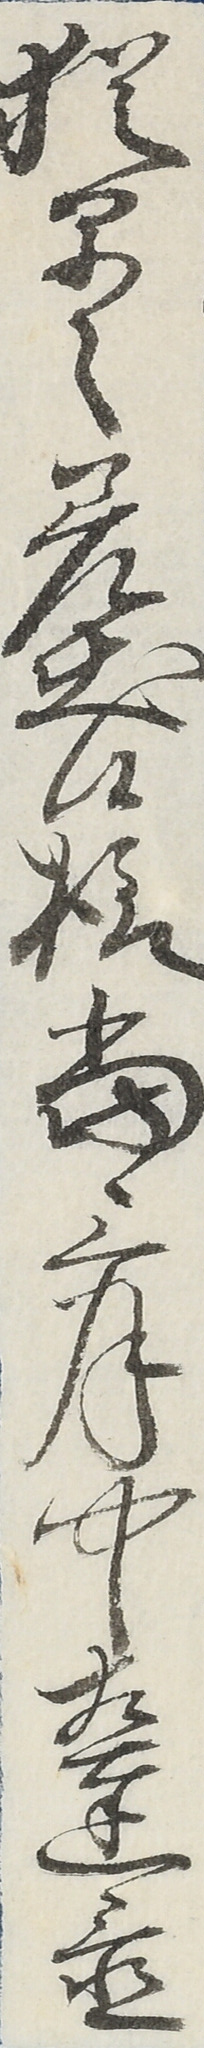猶早々差出候様当三月中相達置
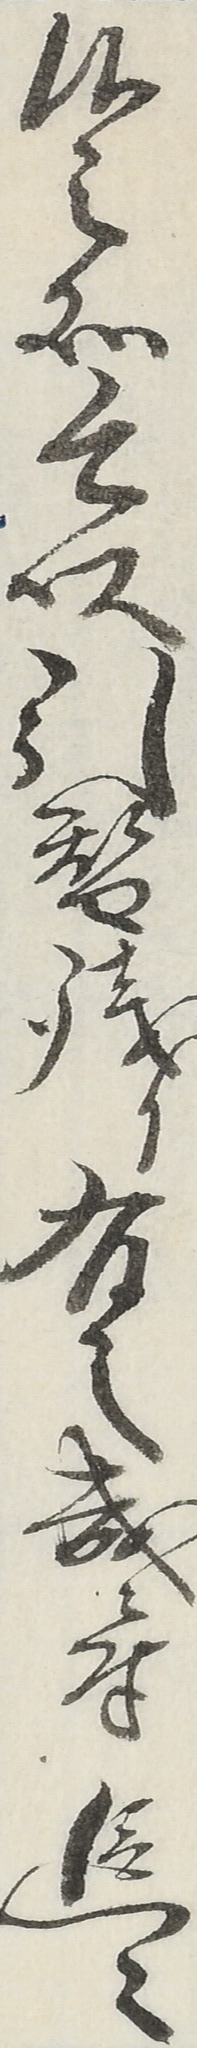候之所今以引替残り有之哉ニ付追々
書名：布達書留
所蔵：伊那市立高遠町図書館・合同会社AMANE
